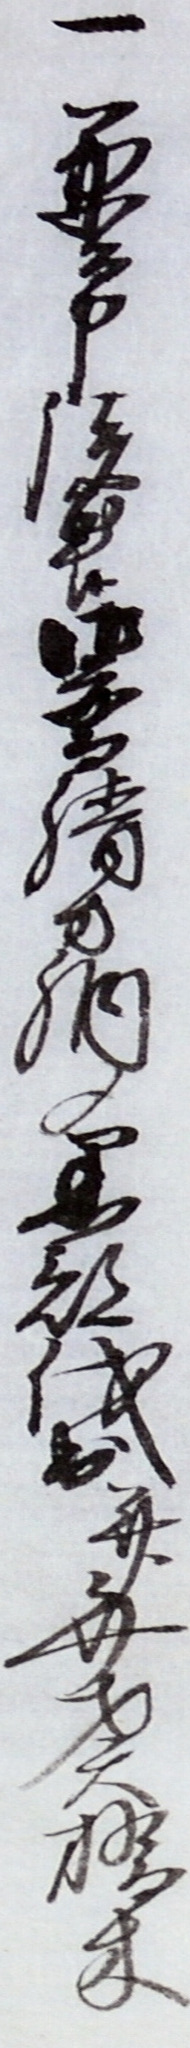一兼而申談置候御普請分納メ黒部伐出并弁才天橋木
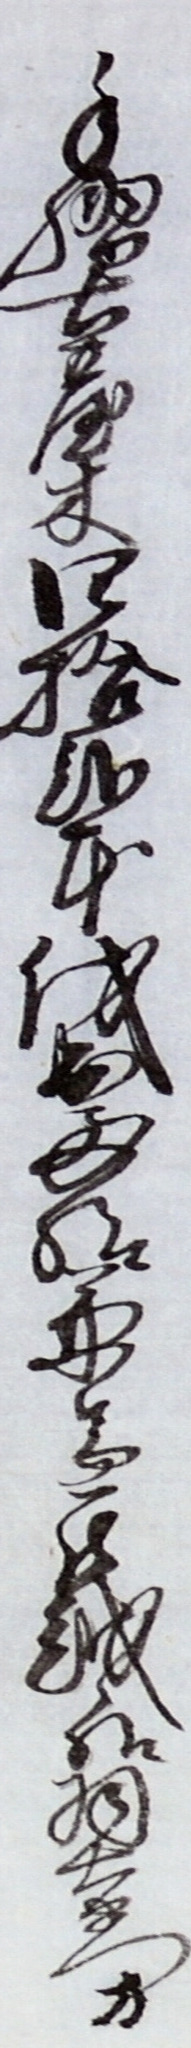手摺古台木四拾弐本伐出両様兼候而罷越候様羽右衛門方
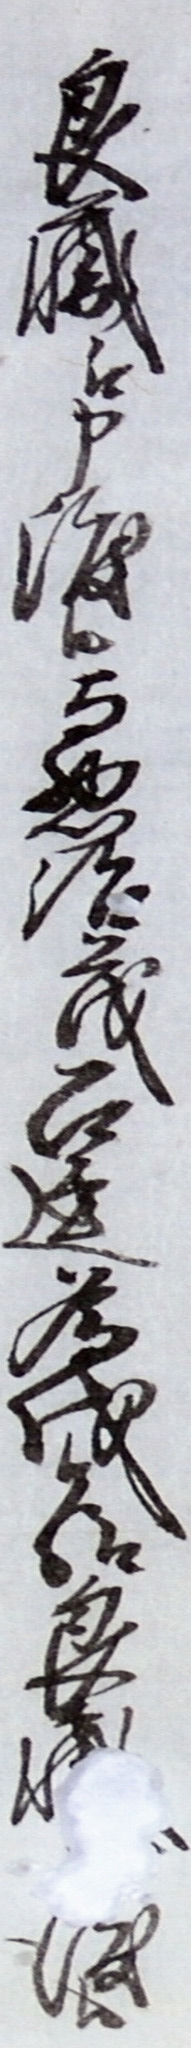良蔵江被申渡候と惣次も召連為伐候様良蔵渡候
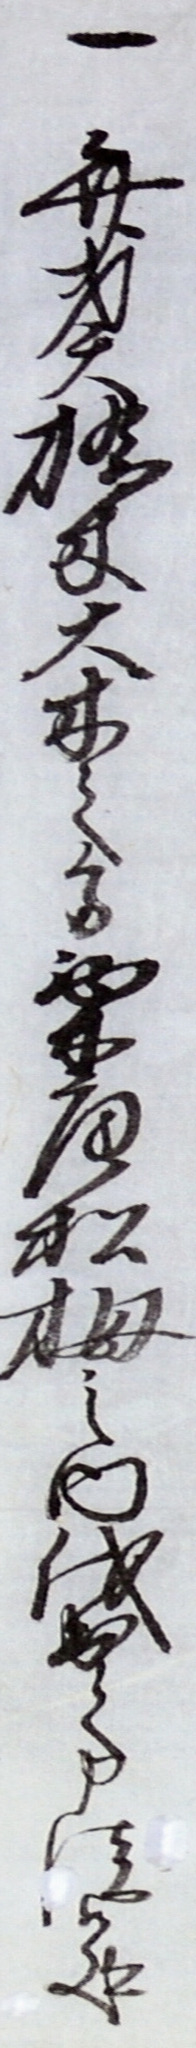一弁才天橋木大木之方栗唐松栂之内伐出之申談候処
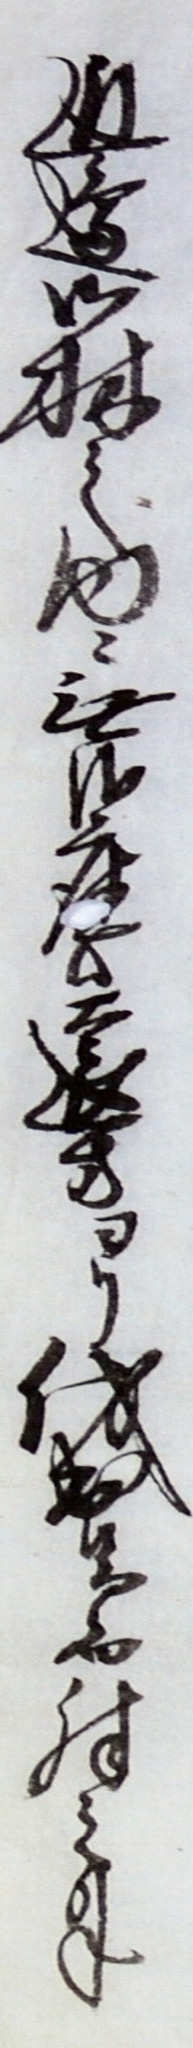近辺御林之内ニ無御座共遠方ヨリ伐出候ニ殊之外

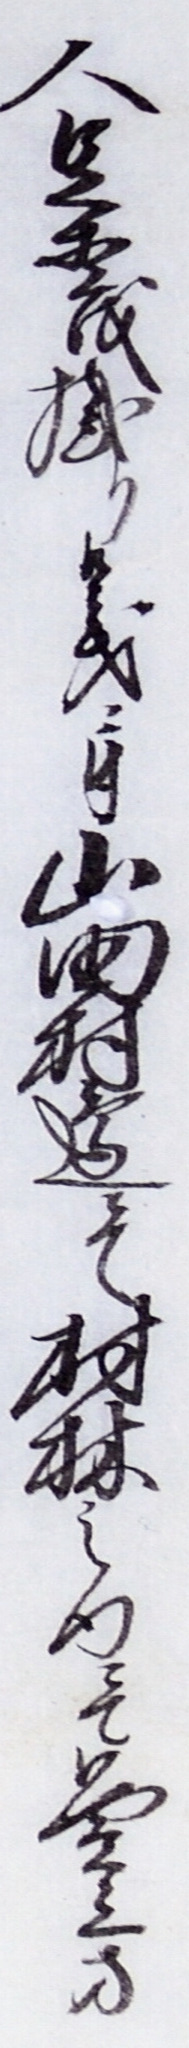人足等も掛り候義ニ付山田村辺ニて村林之内ニて御買上方
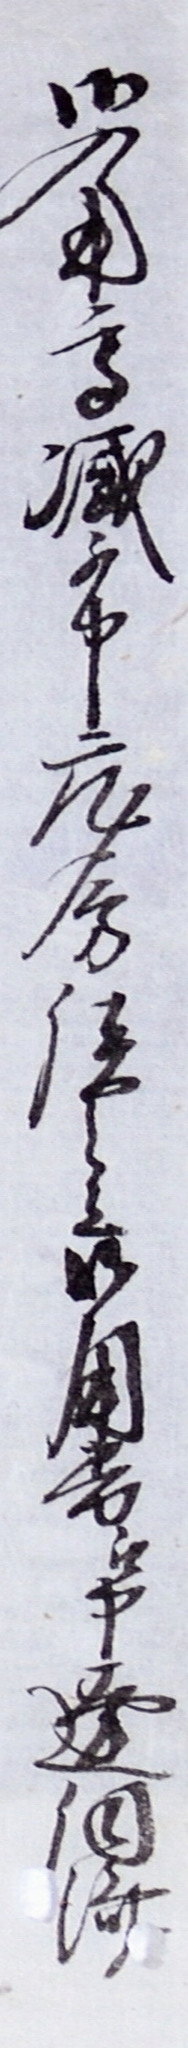御入用高減不申元〆方談之上御用番江申達伺済
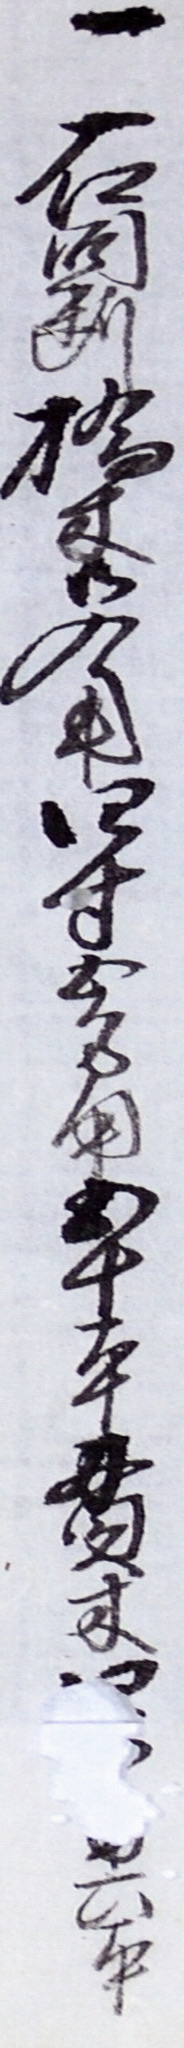一右同断橋木御入用四寸五分角五十本貫木六本
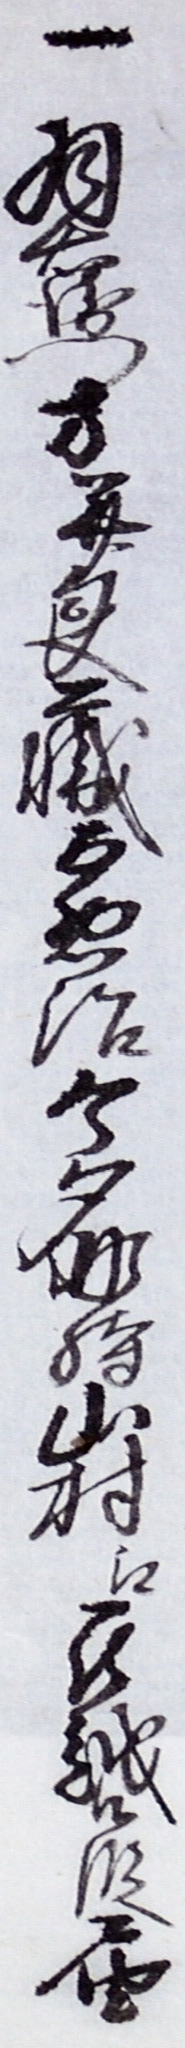一羽右衛門方并良蔵与惣治今夕非持山村江罷越候段届
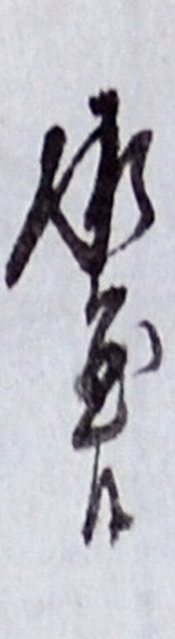承置候
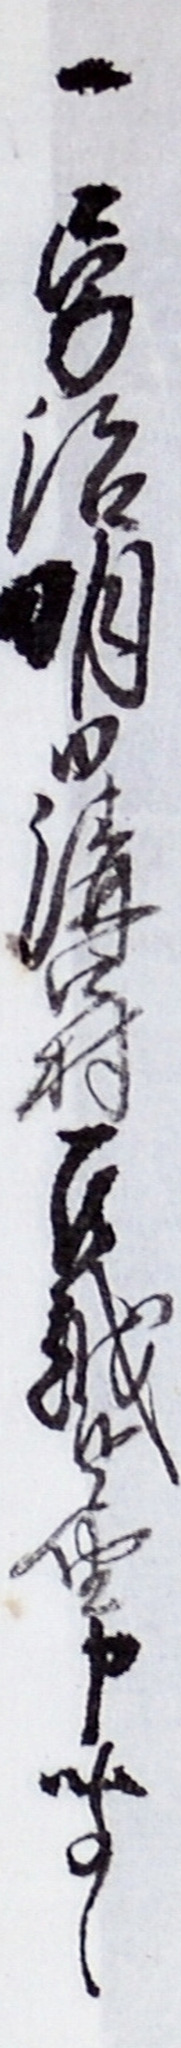一勇治明日溝口村罷越候届申聞候
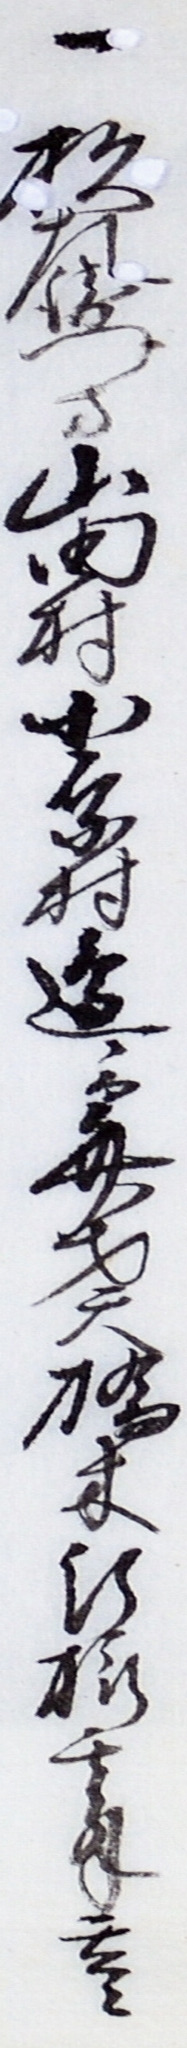一杉左衛門方山田村小原村辺ニ而弁才天橋木行桁其外共ニ
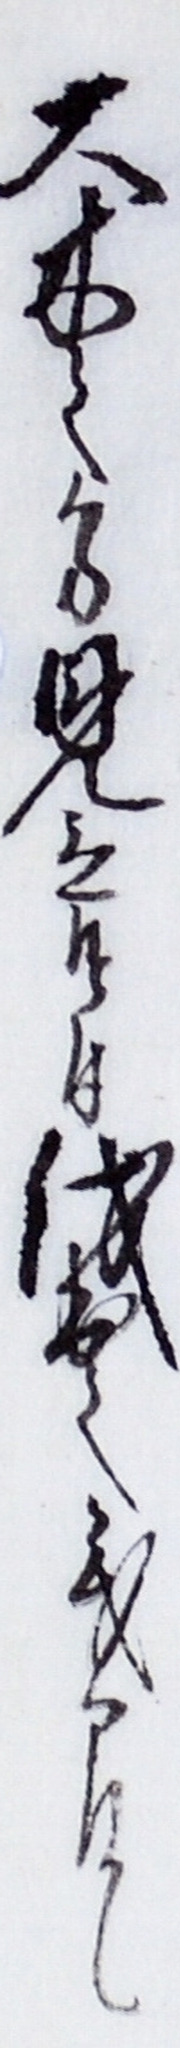大木之分見立候ニ付伐出之義申付候
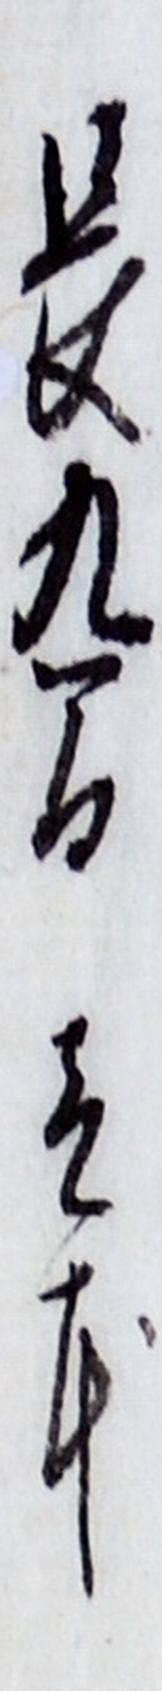長九間壱本
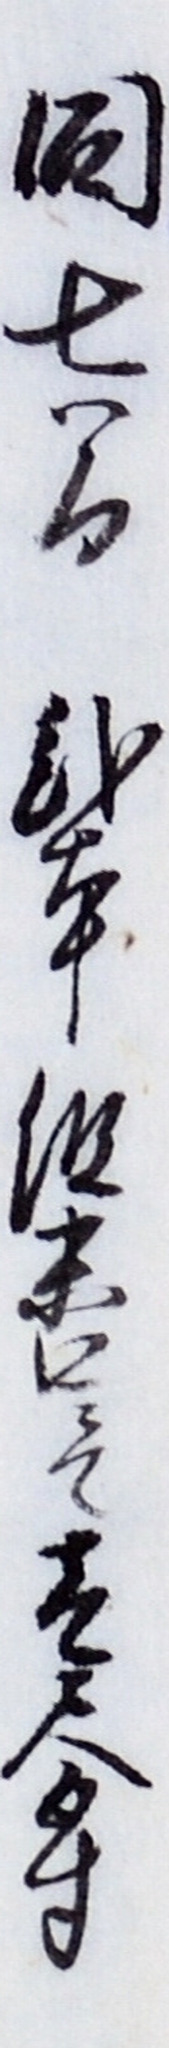同七間弐本但末口ニて壱尺五寸
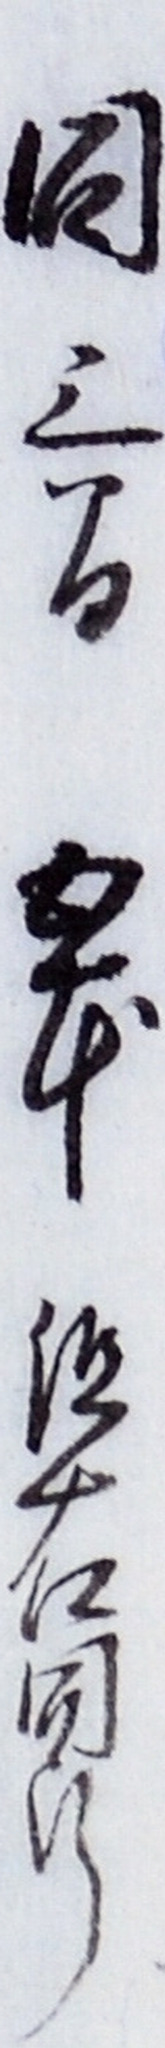同三間五本但右同断
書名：御山奉行御用控
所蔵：伊那市立高遠町図書館・合同会社AMANE
